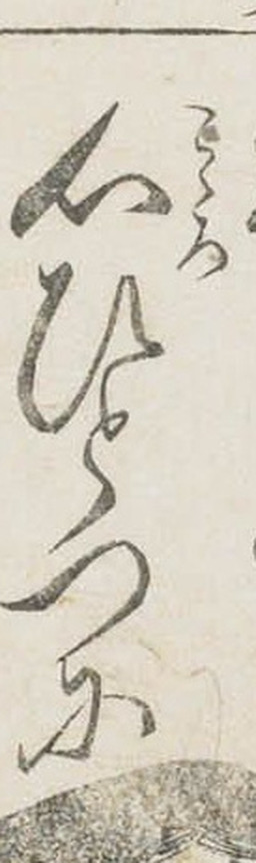心ひとつに
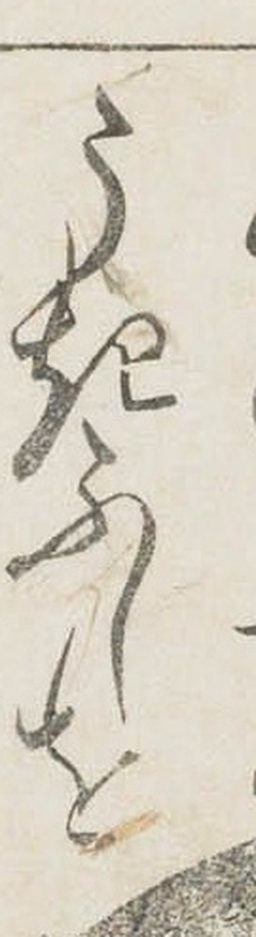うきふしを
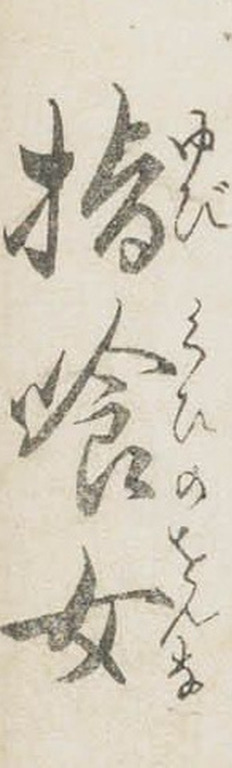指喰女
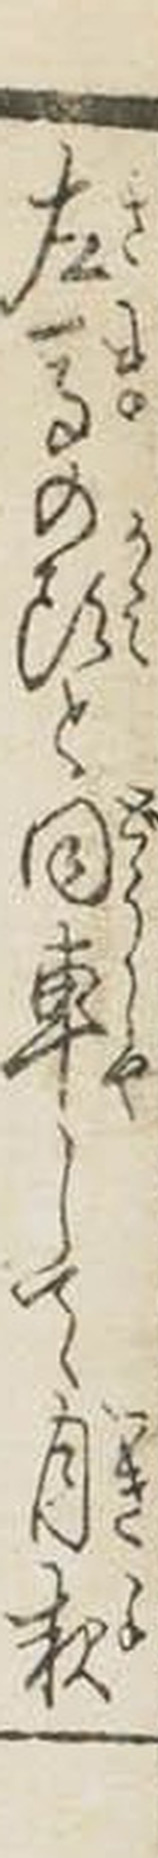左馬の頭と同車して月夜
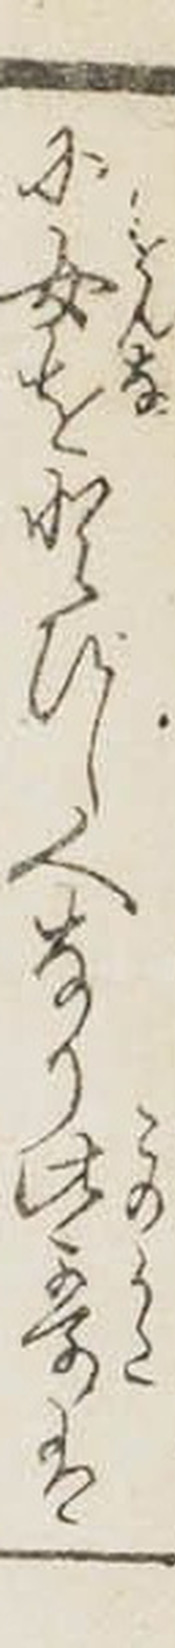に女をとひし人なり此哥は
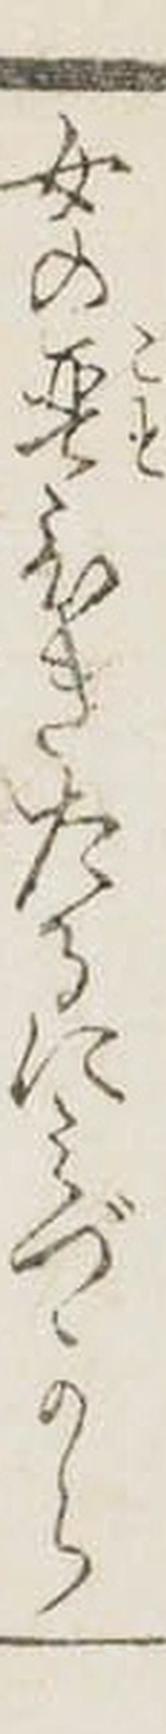女の琴ひきたるにみづから
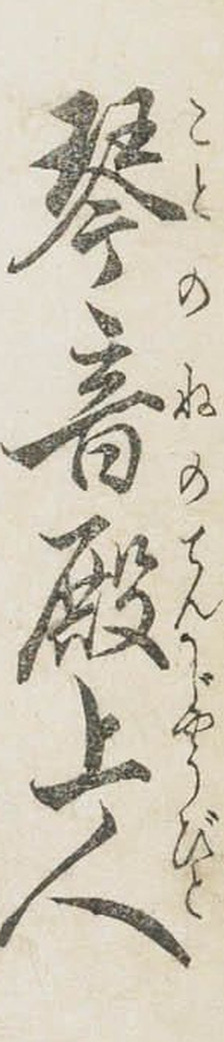琴音殿上人
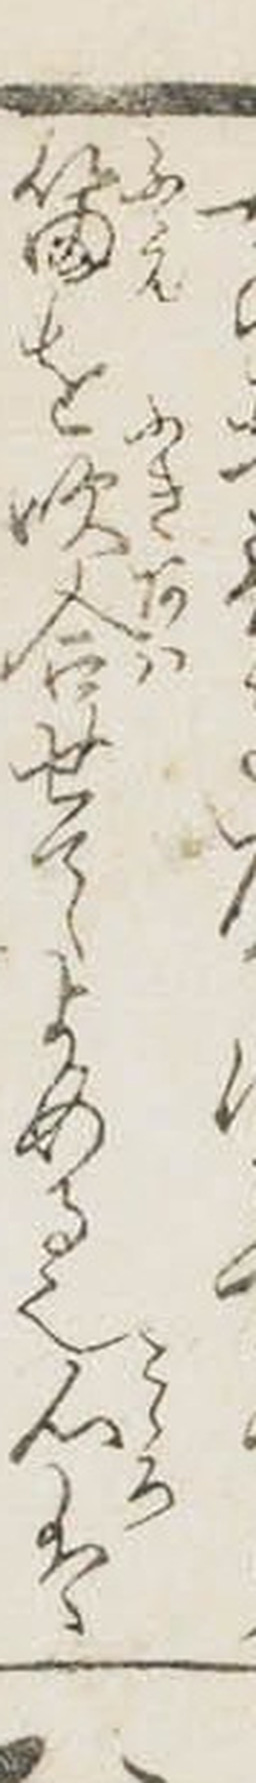笛を吹合せてよめる也心は
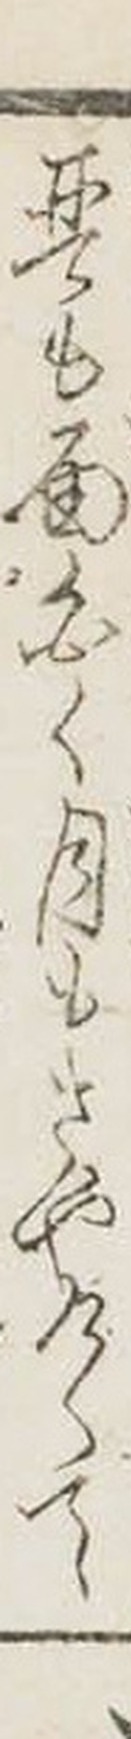琴も面白く月もさやけくて
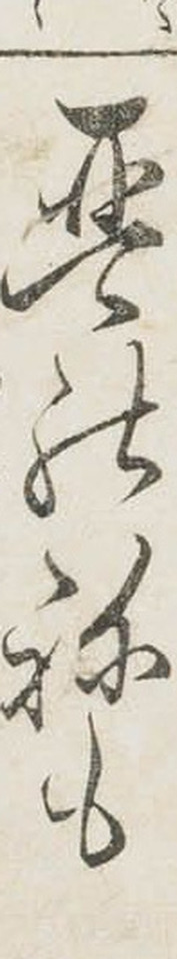琴のねも
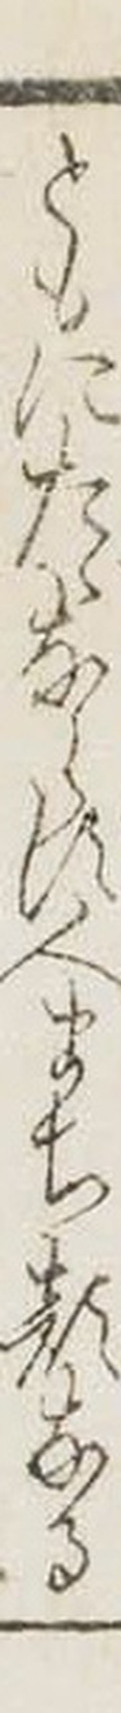ともにたゞならず人まち顔なる
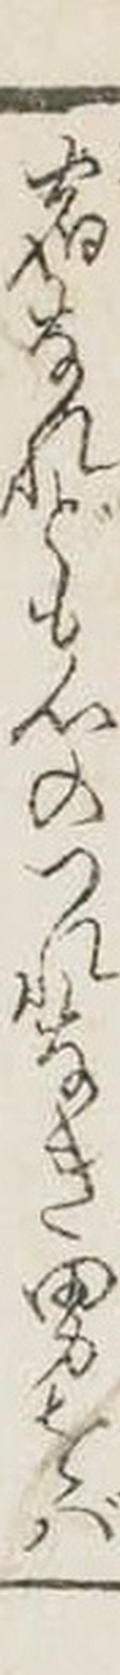宿なれども心のつれなき男をば
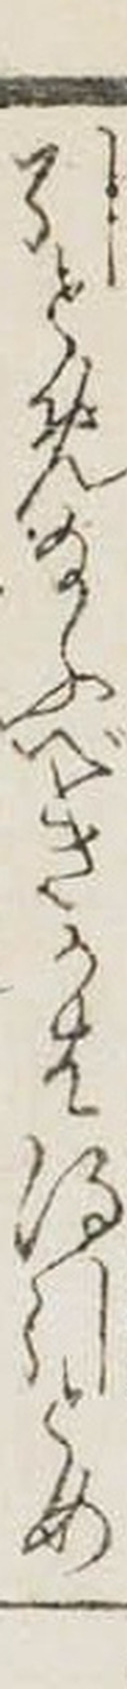引とめ給ふべきかは得引とめ
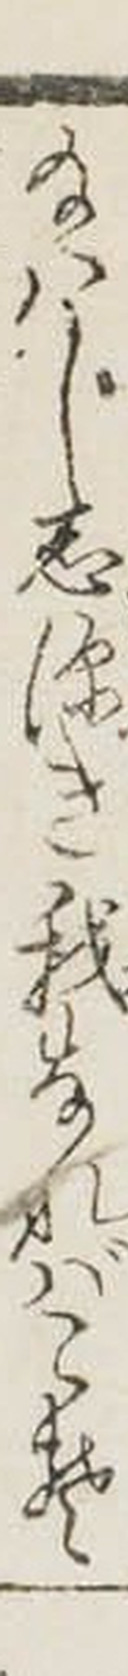給はじ志深き我なればこそ
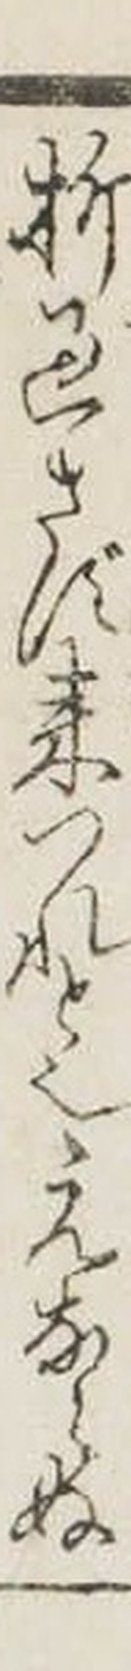折過さず来つれと也えならぬ
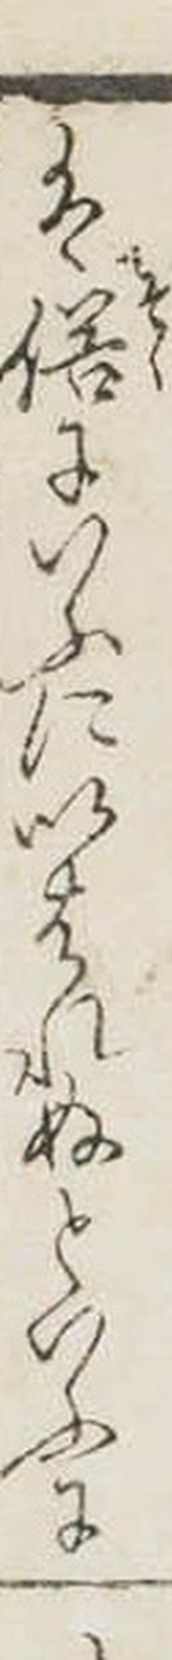は俗にいふにいはれぬといふに
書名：源氏百人一首
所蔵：東京学芸大学教育コンテンツアーカイブ
